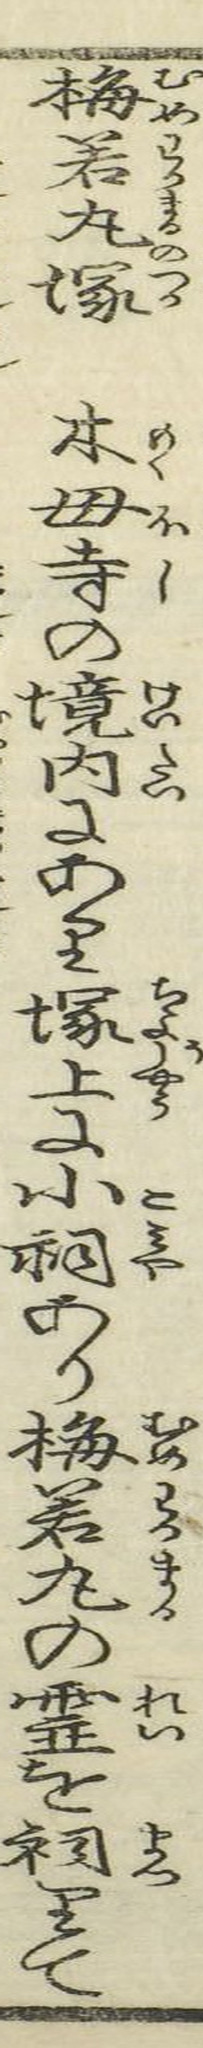梅若丸塚木母寺の境内にあり塚上に小祠あり梅若丸の霊を祠りて
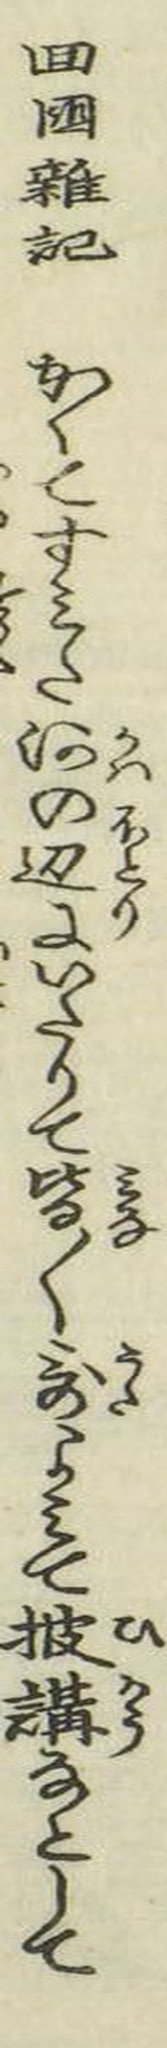回国雑記かくてすみた河の辺にいたりて皆〳〵歌よみて披講なとして
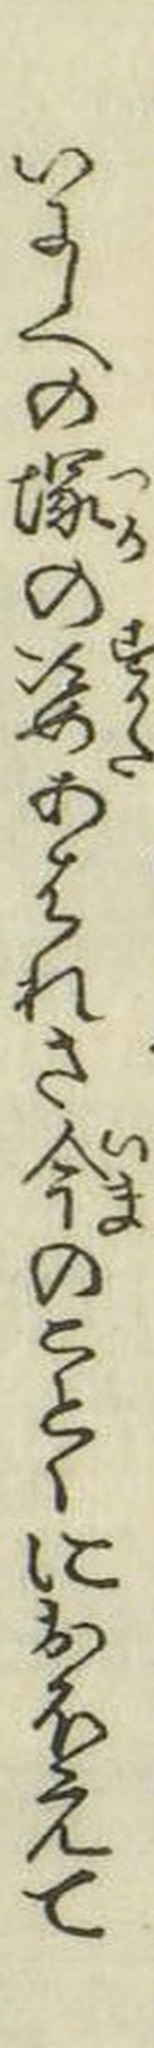いにしへの塚の姿あはれさ今のことくにおほえて
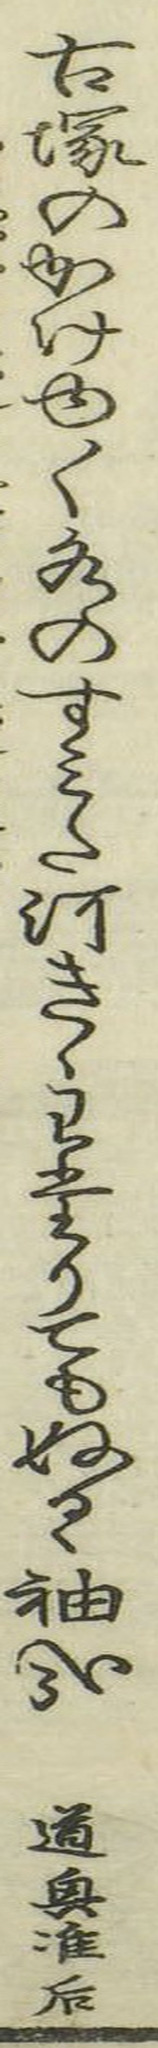古塚のかけゆく水のすみた河きゝわたりてもぬるゝ袖哉道興准后
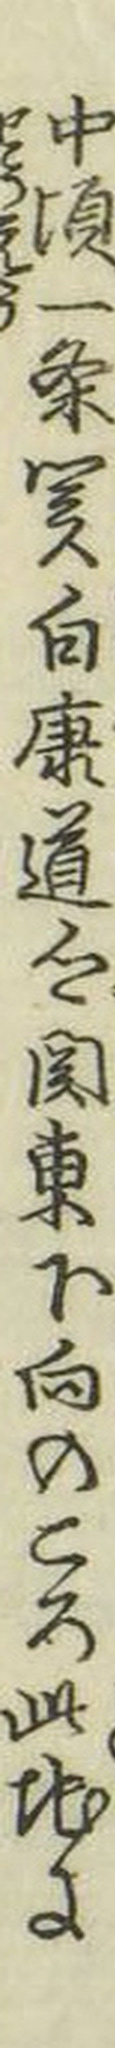中頃一条関白康道卿関東下向のころ此地に
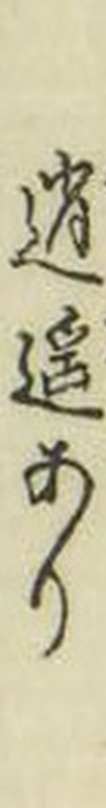逍遥あり

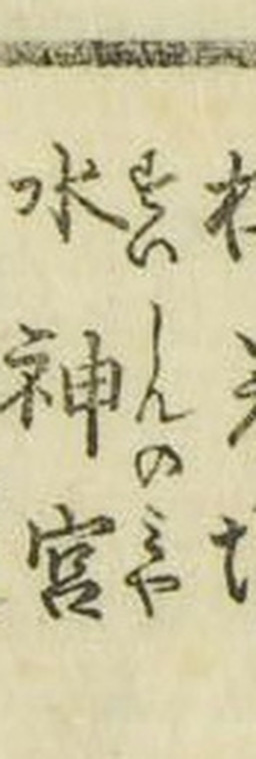水神宮
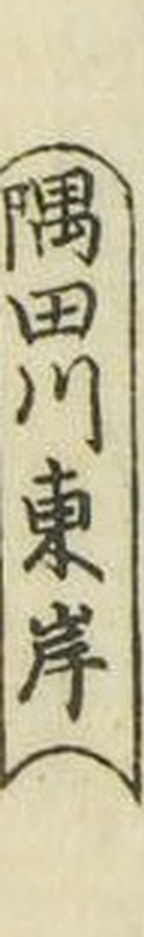隅田川東岸
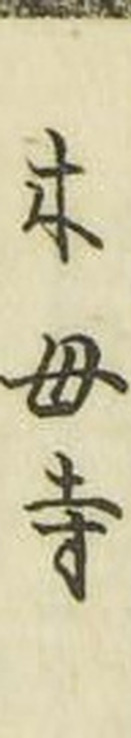木母寺
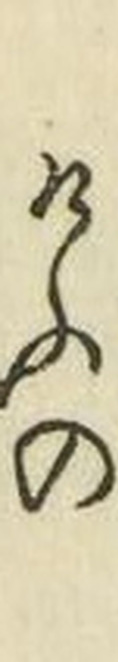けふの
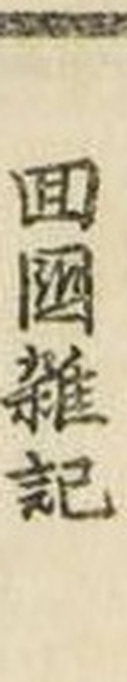回国雑記
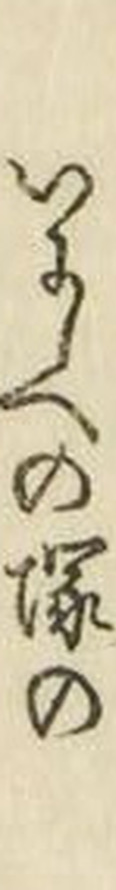いにしへの塚の
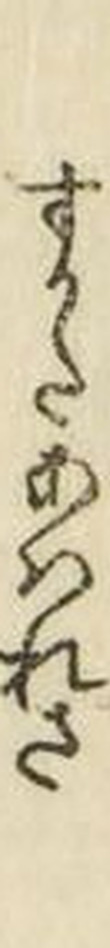すかたあはれさ
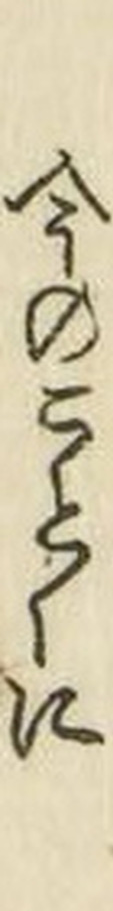今のことくに
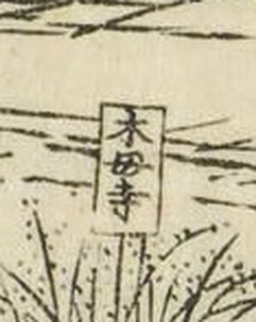木母寺
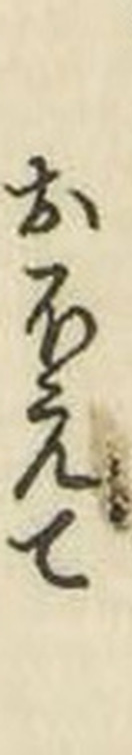おほえて
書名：江戸名所図会 20巻 巻之19
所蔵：東京学芸大学教育コンテンツアーカイブ
